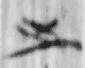之
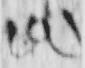州
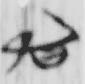加
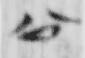公
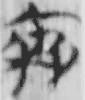秦
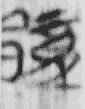○（复）
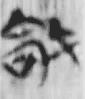○（令）
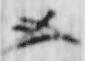之
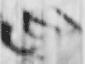州
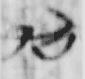加
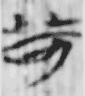苛
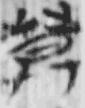登
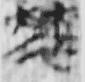○（勞）
